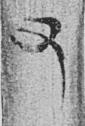又（有）
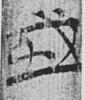城（成）
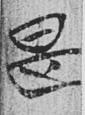是
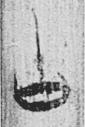古（故）
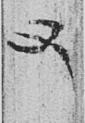又（有）
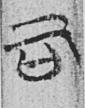司
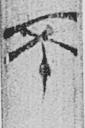不
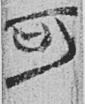可
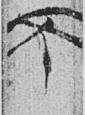不
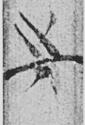先
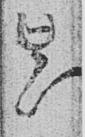也
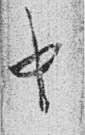中（仲）
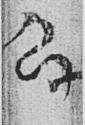弓
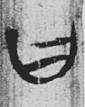曰
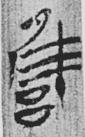○（雍）
